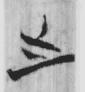之
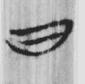日
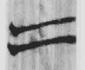二
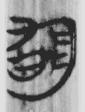旬
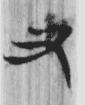又
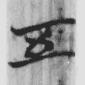五
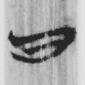日
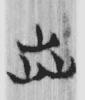芔
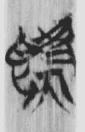{既火}
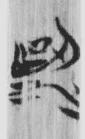渴
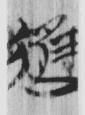進
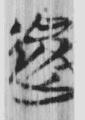退
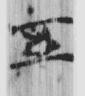五
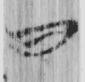日
